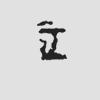皿
